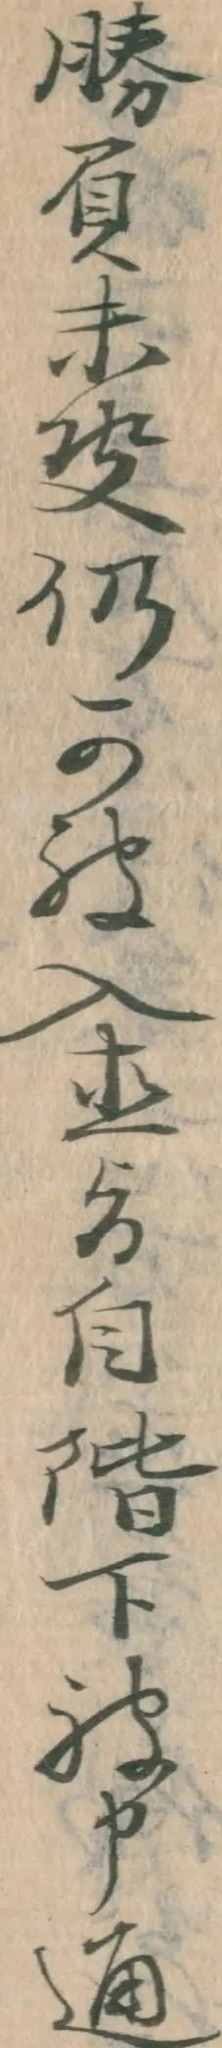勝負未決仍可被入直旨自階下被申通
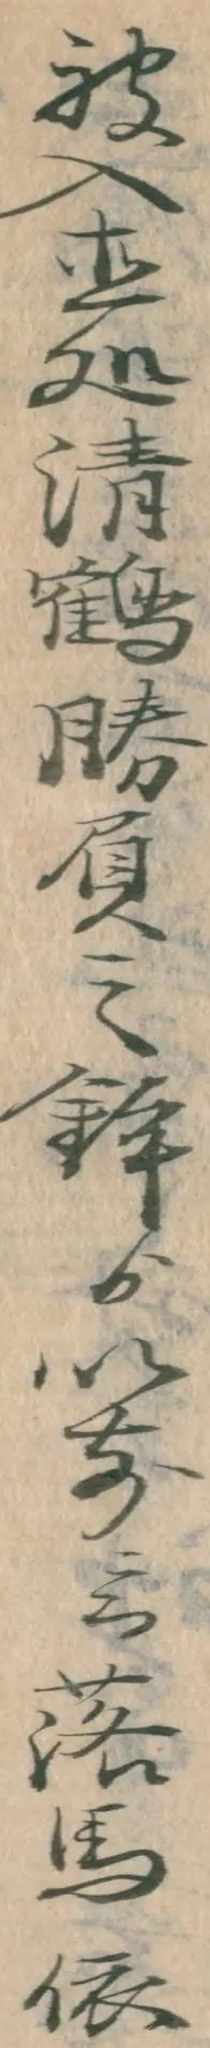被入直処清鶴勝負之鉾ゟ以前ニ而落馬依
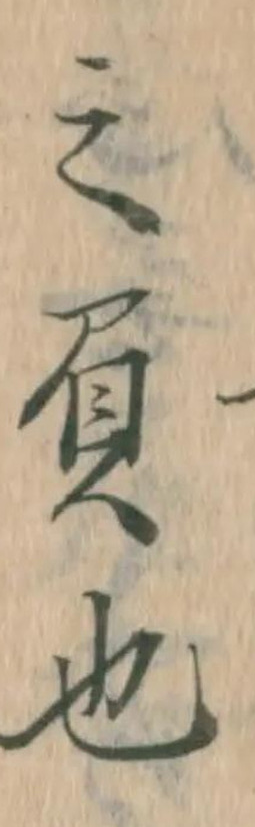之負也
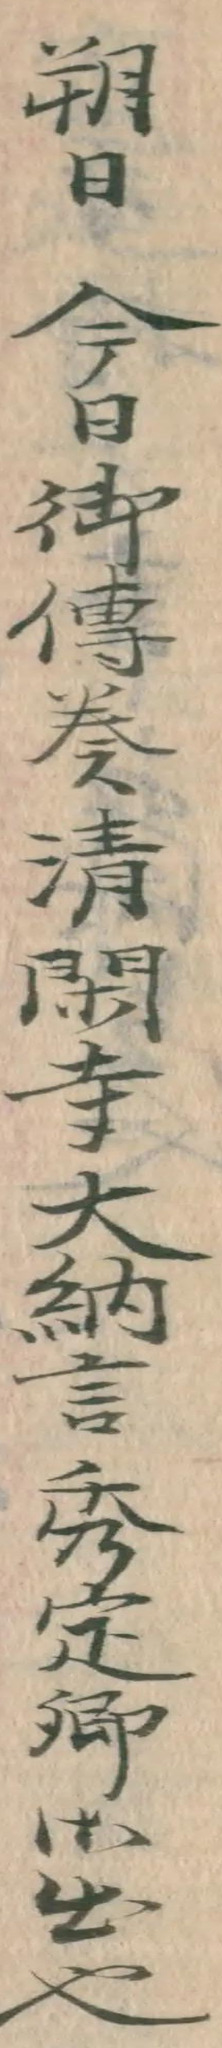朔日今日御伝奏清閑寺大納言秀定卿御出也
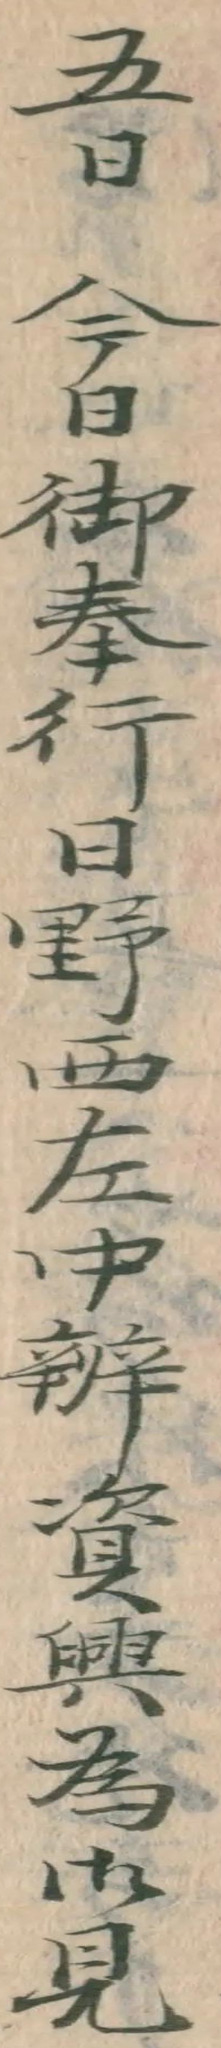五日今日御奉行日野西左中弁資興為御見
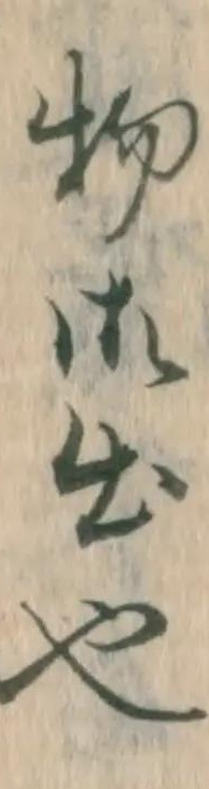物御出也
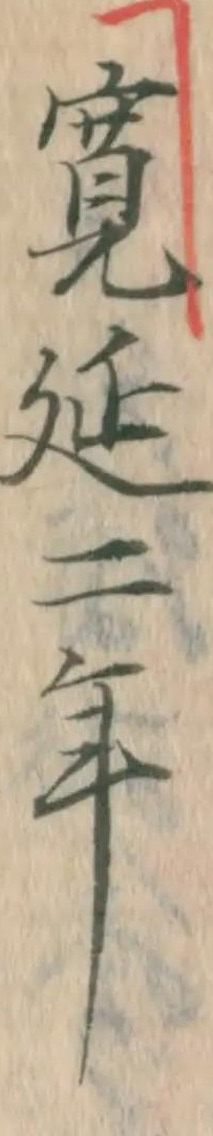寛延二年
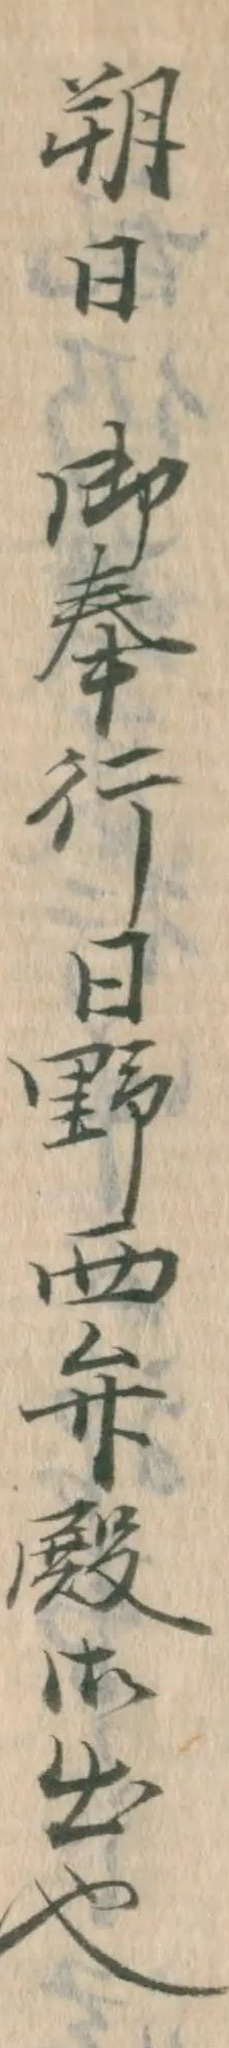朔日御奉行日野西弁殿御出也
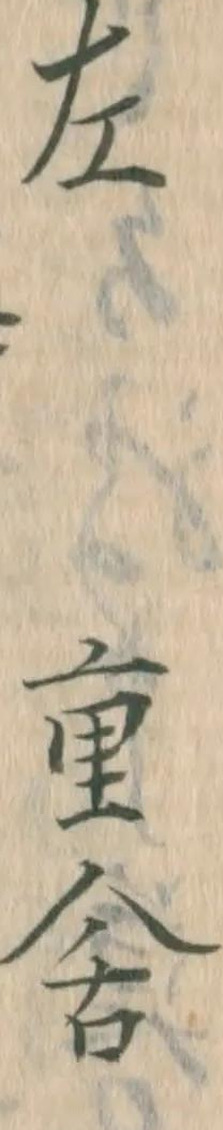左重舎
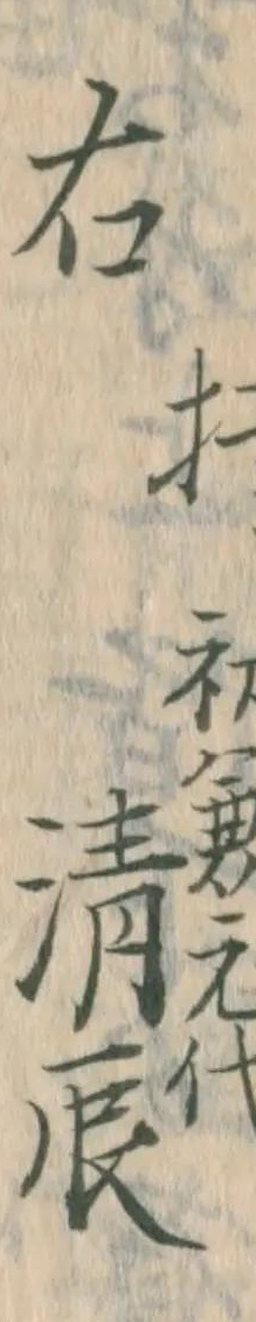右清辰

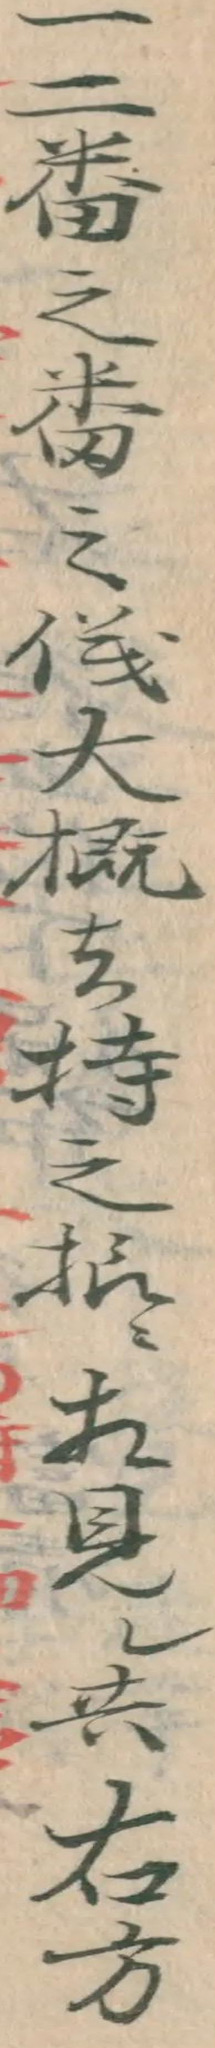一二番之番之儀大概者持之様ニ相見レ共右方
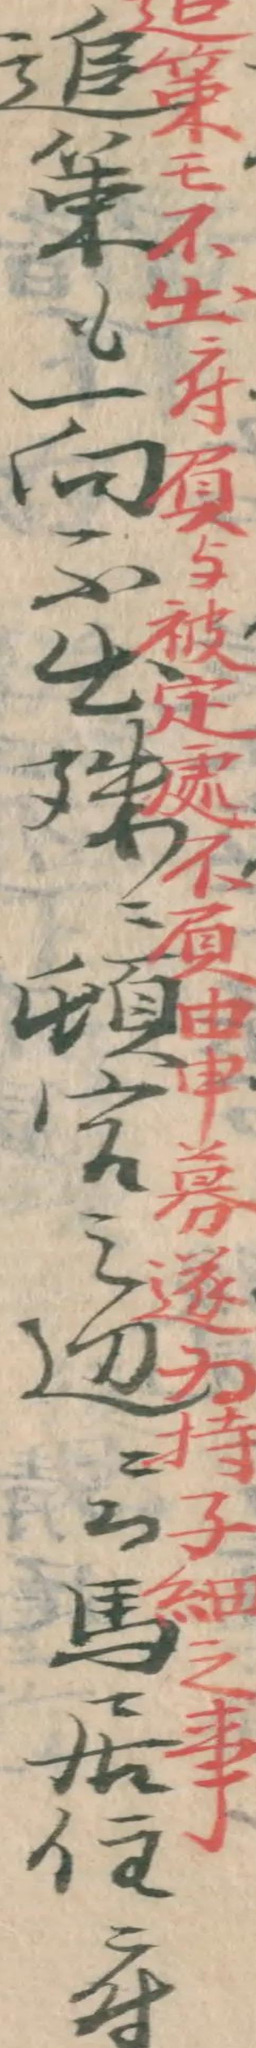追乗も一向不出殊ニ頓宮之辺ニ而馬居住ニ付
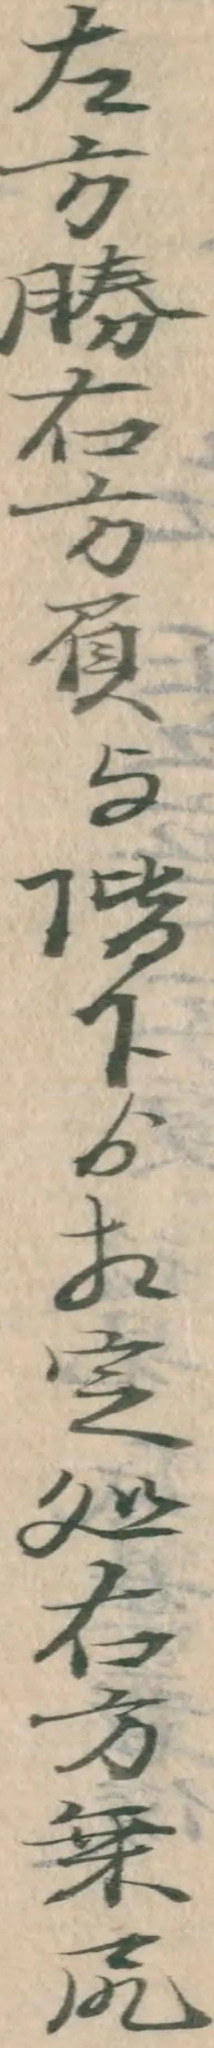左方勝右方負与階下ゟ相定処右方乗尻
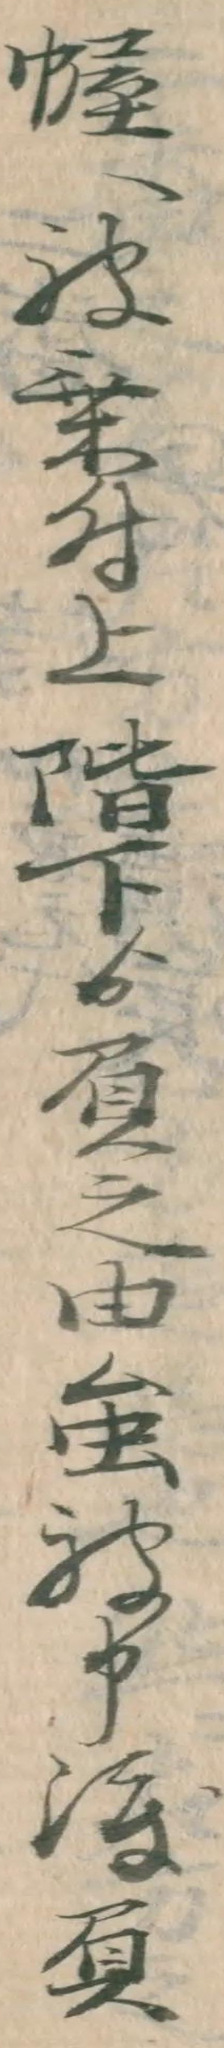幄へ被乗付上階下ゟ負之由雖被申渡負
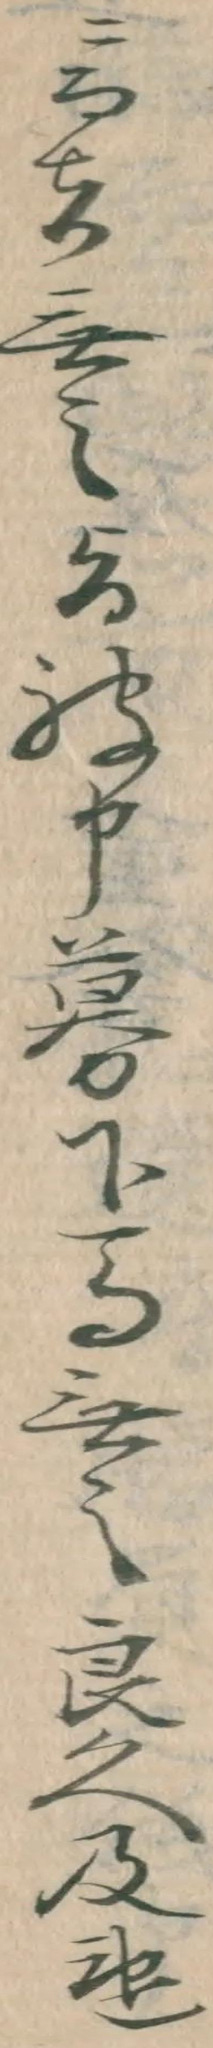ニ而者無之旨被申募下馬無之良久及違
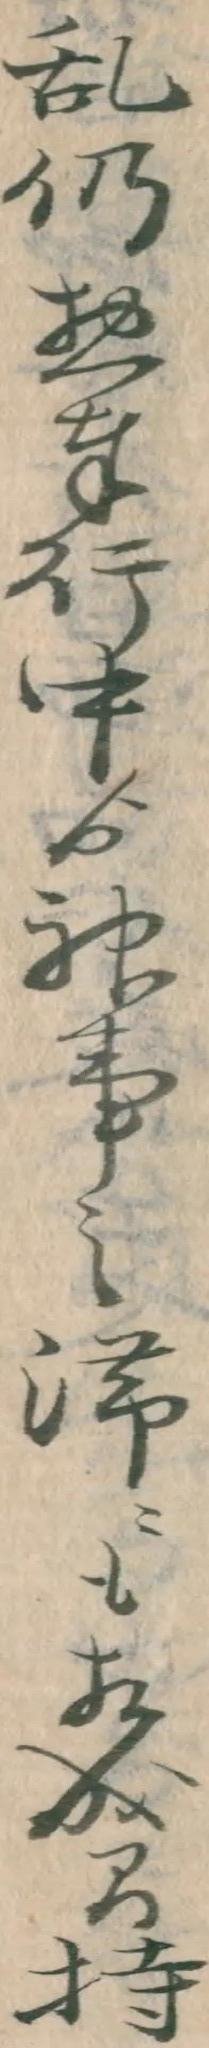乱仍惣奉行中ゟ神事之滞ニも相成間持
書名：賀茂社記録. 第10冊
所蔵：国立国会図書館 National Diet Library, JAPAN
